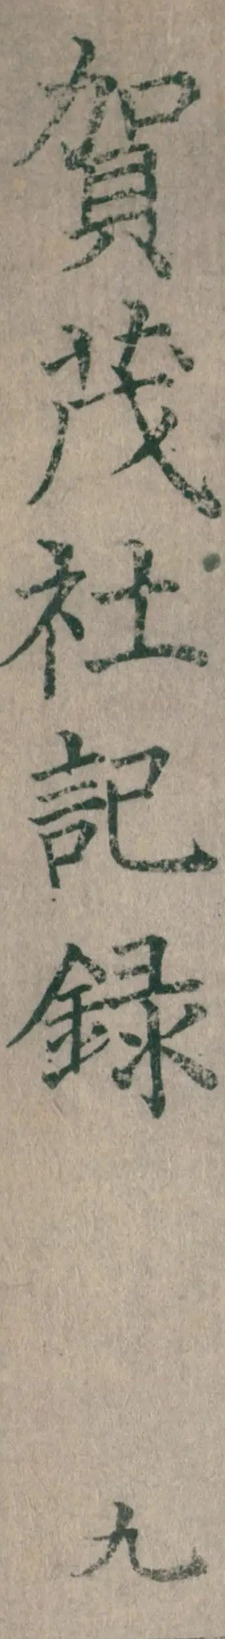賀茂社記録九

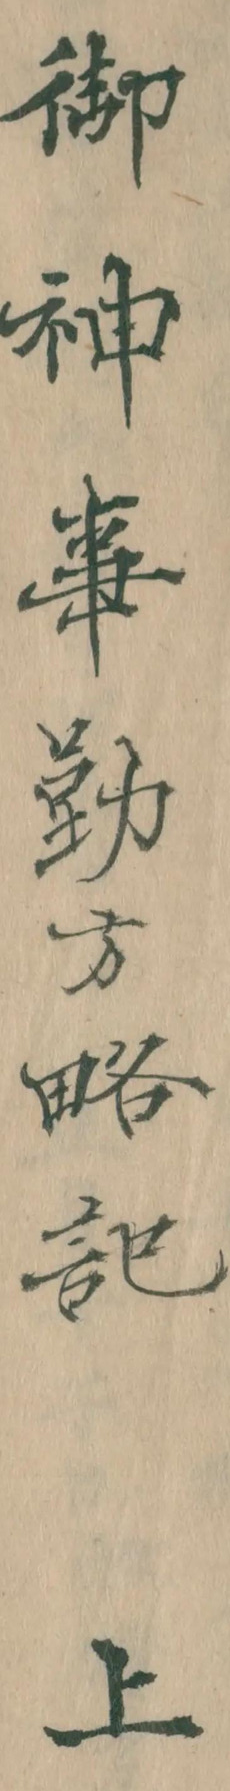御神事勤方略記上

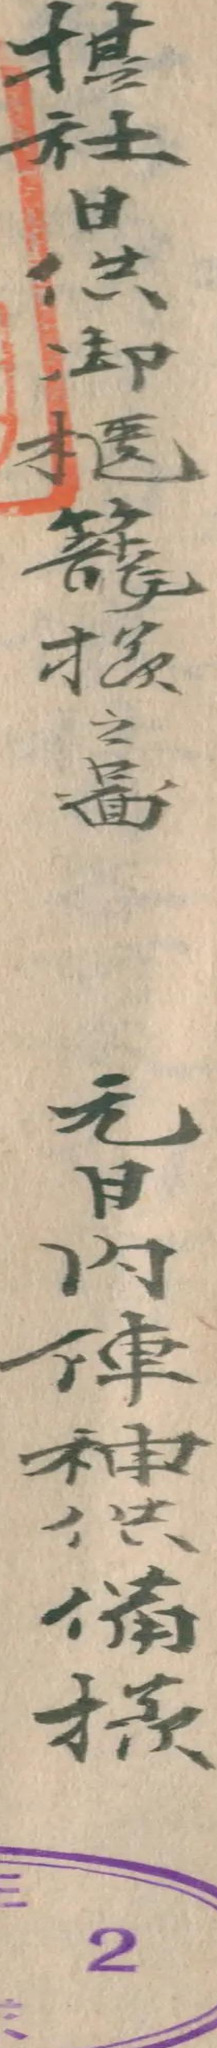摂社日供御櫃籠様之図元日内陣神供備様
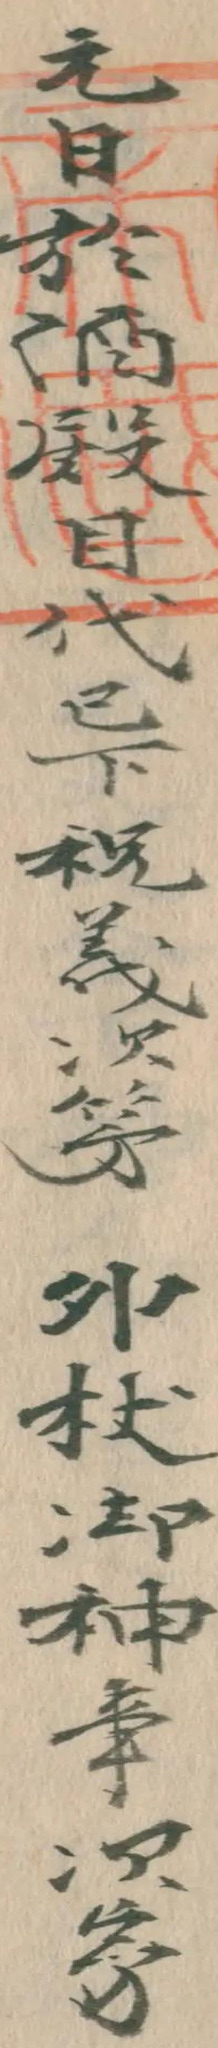元日於酒殿目代巳下祝義次第卯杖御神事次第
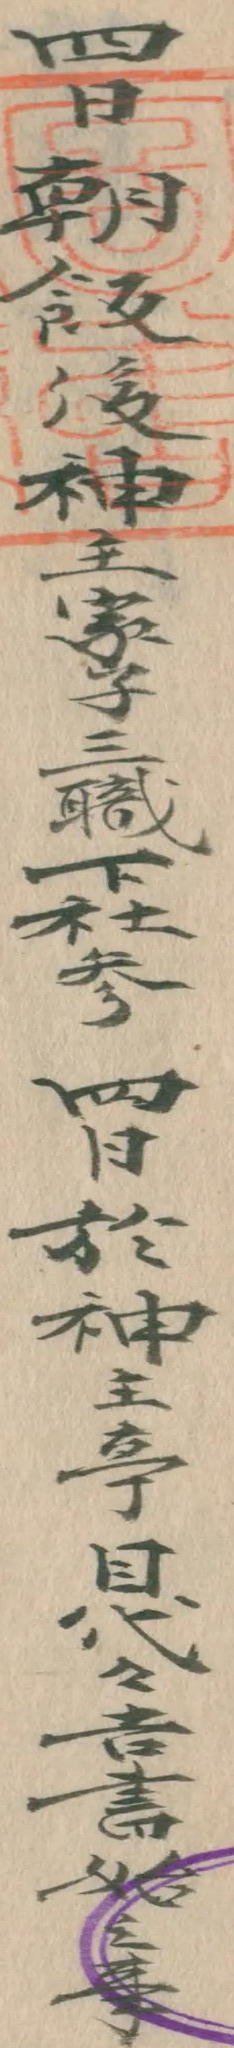四日朝飯後神主家子三職下社参四日於神主亭目代々吉書始之事
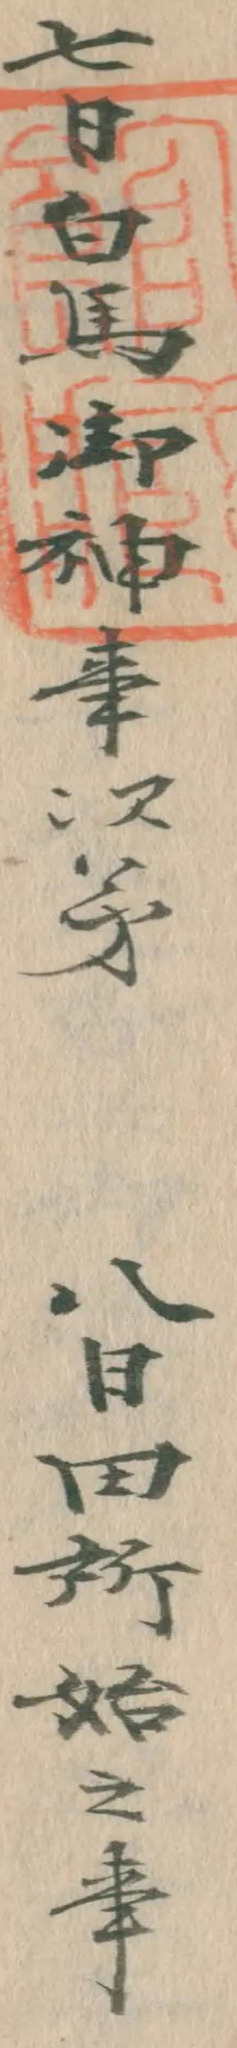七日白馬御神事次第八日田所始之事
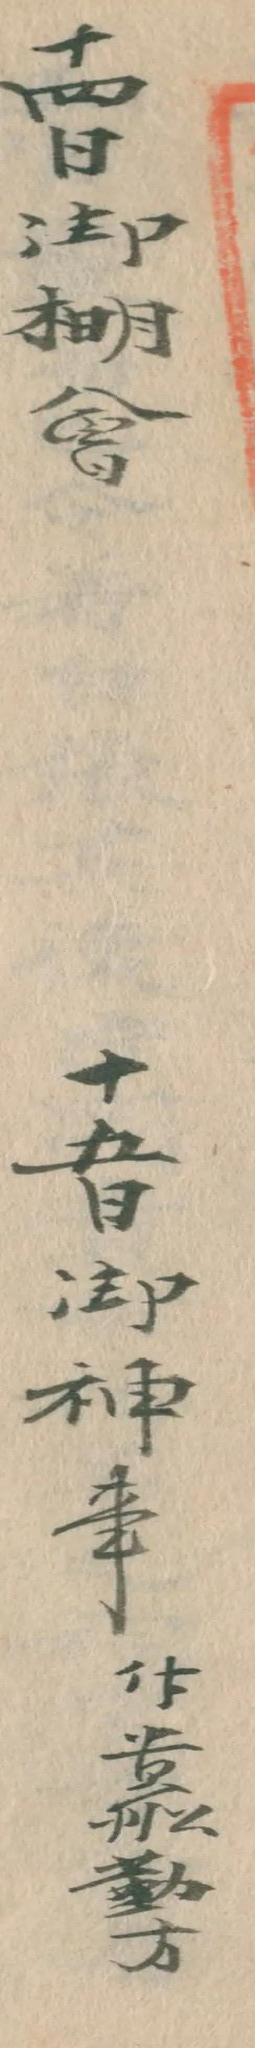十四日御棚会十五日御神事付貴船勤方
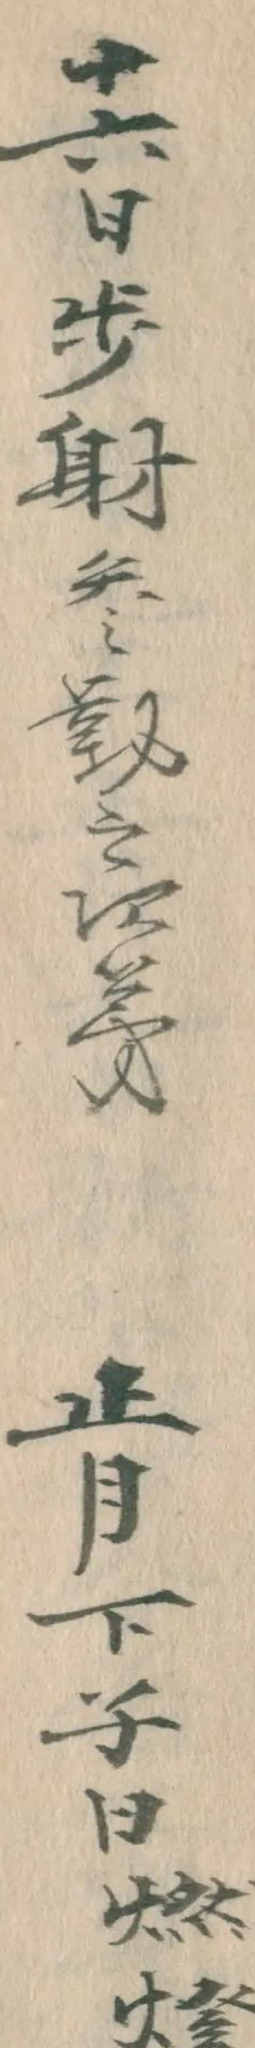十六日歩射参勤之次第正月下子日燃燈祭

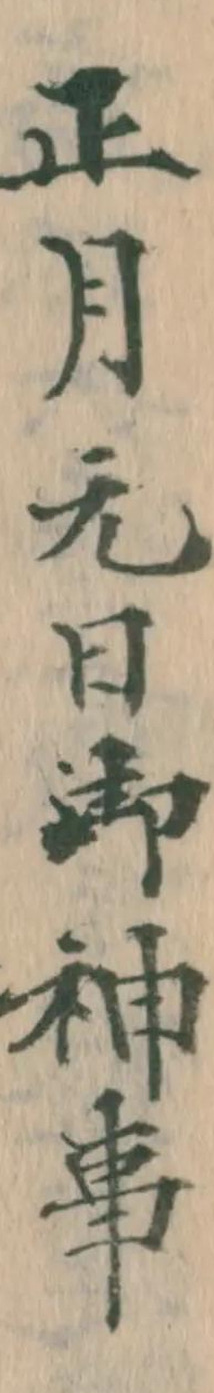正月元日御神事
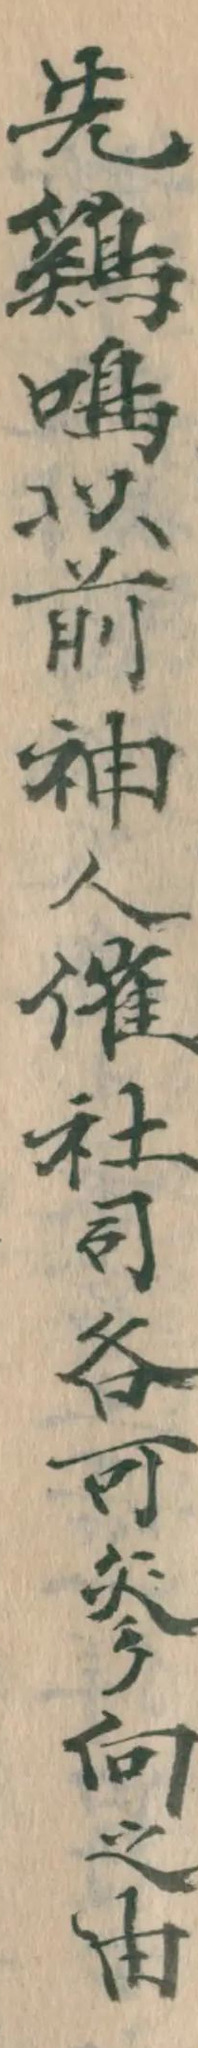先鶏鳴以前神人催社司各可参向之由
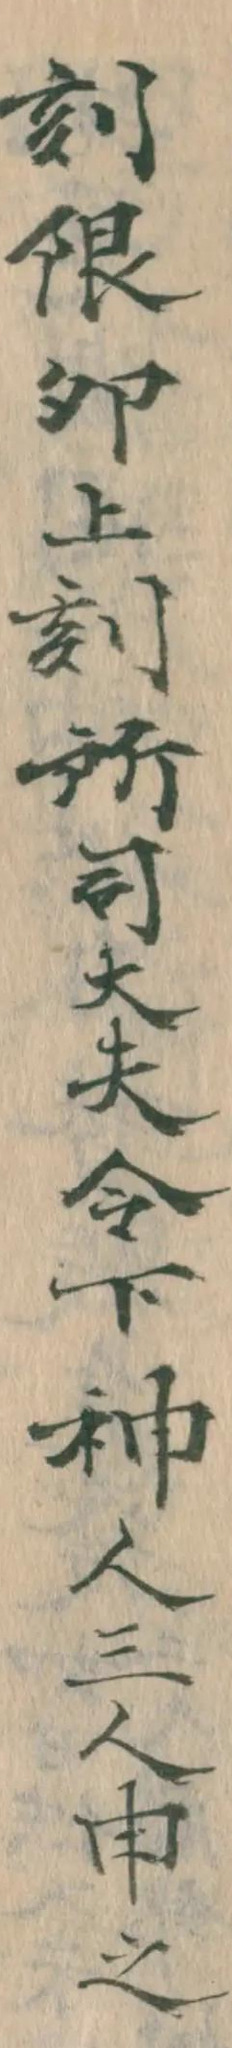刻限卯上刻所司大夫令下神人三人申之
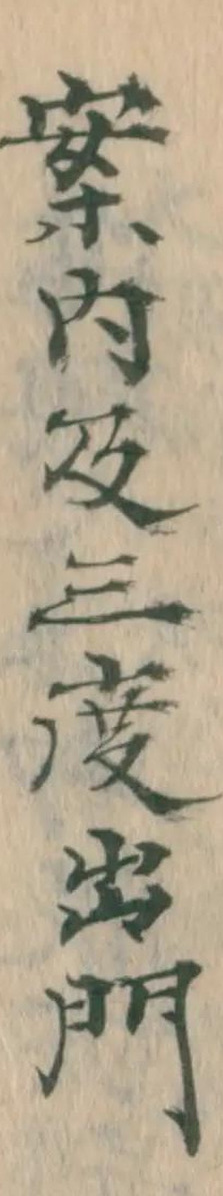案内及三度出門
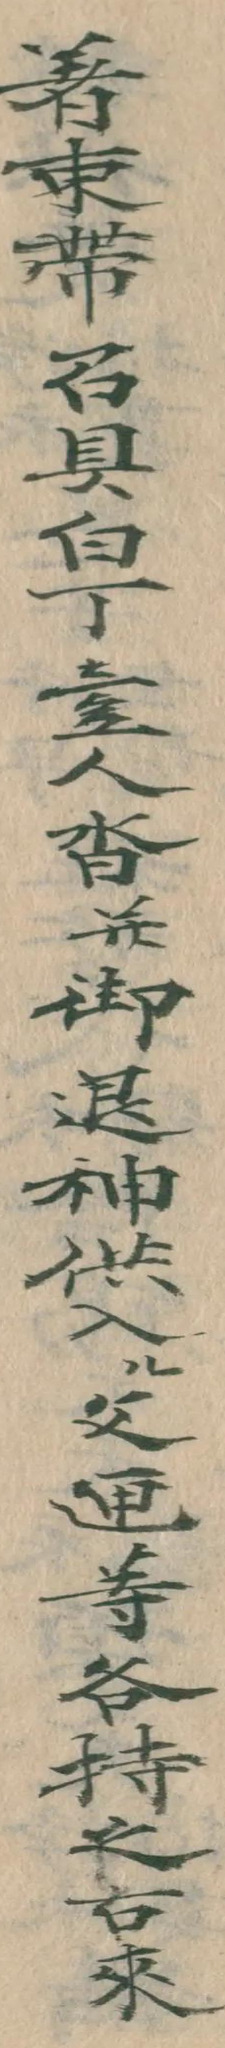着束帯召具白丁壱人沓并御退神供入ル父匣等各持之右来
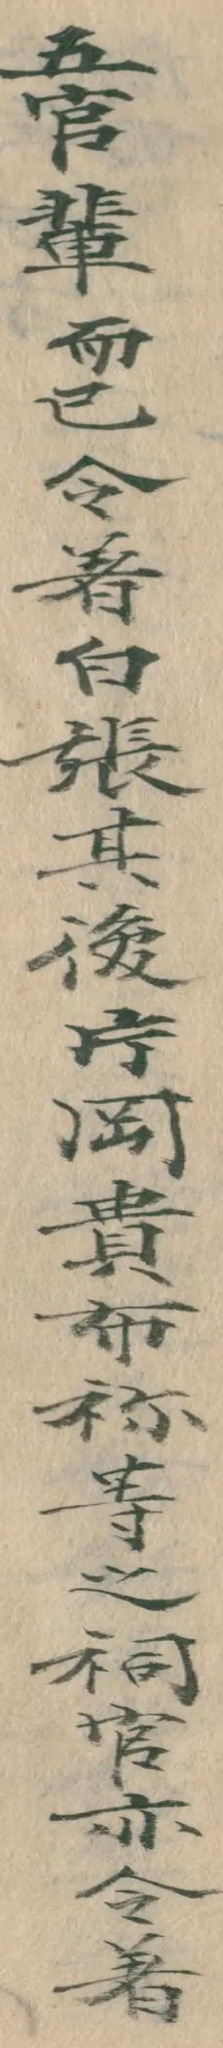五官輩而已令着白張其後片岡貴布称等之祠官亦令着
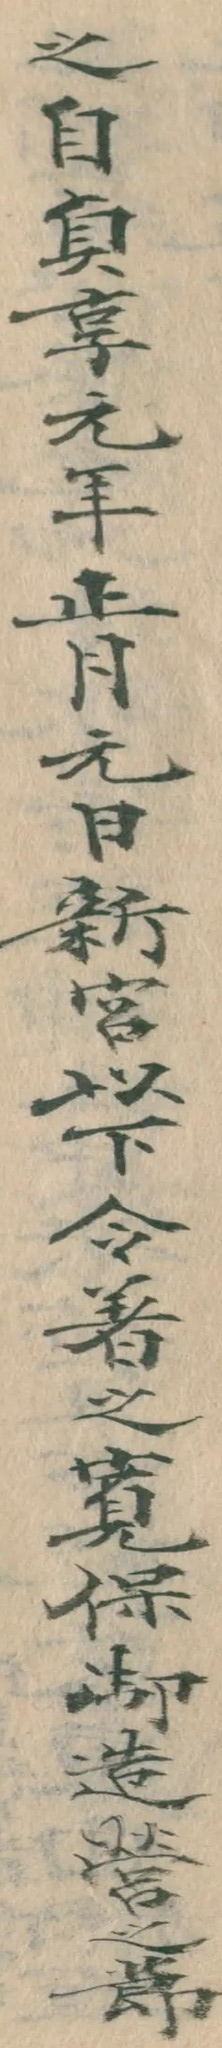之自貞享元年正月元日新宮以下令着之寛保御造営之節
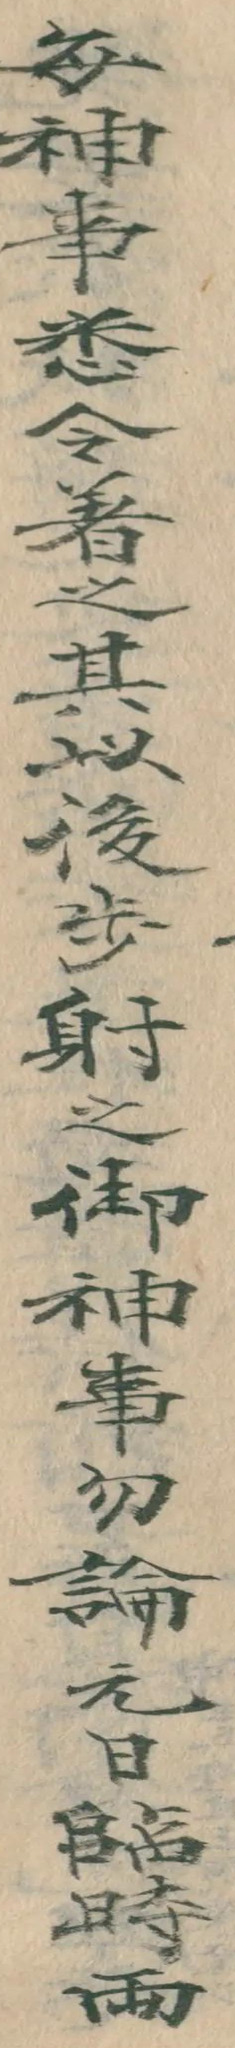毎神事悉令着之其以後歩射之御神事勿論元日臨時両
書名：賀茂社記録. 第9冊
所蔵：国立国会図書館 National Diet Library, JAPAN
